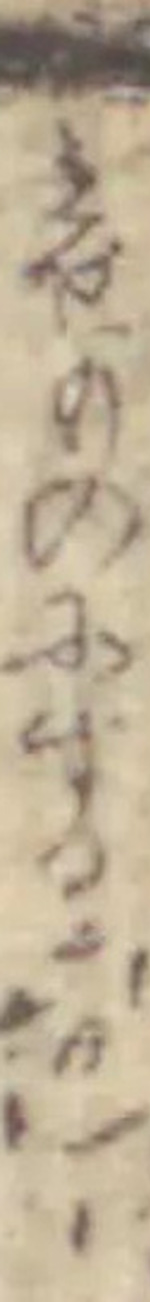みせものにする
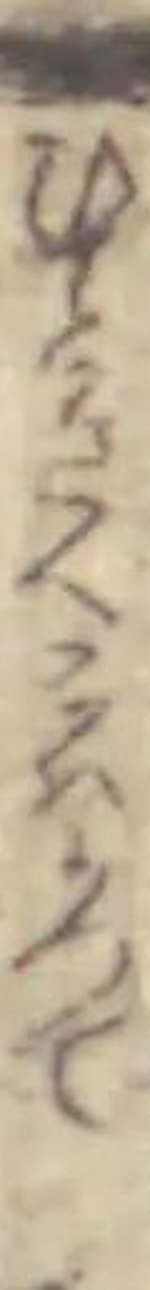ひとさへこはかつて
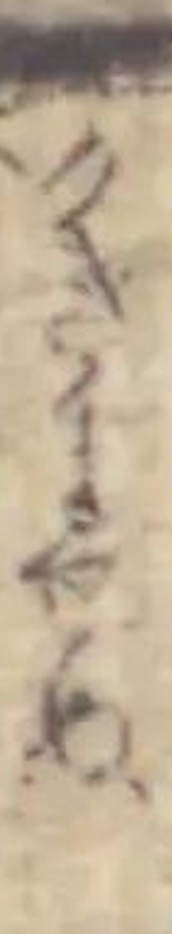いきませぬ
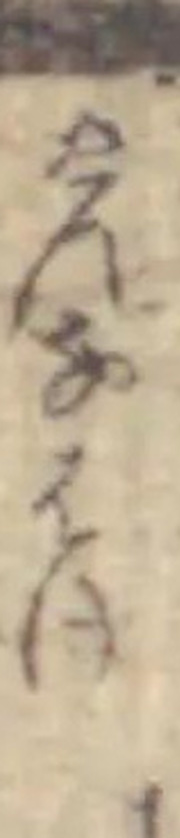とんなはけ
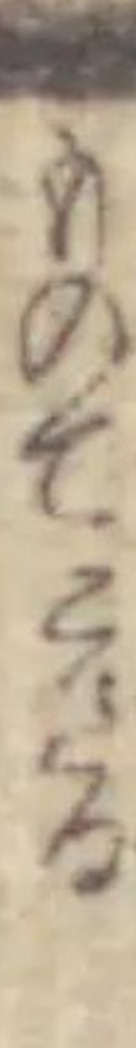ものてこさる
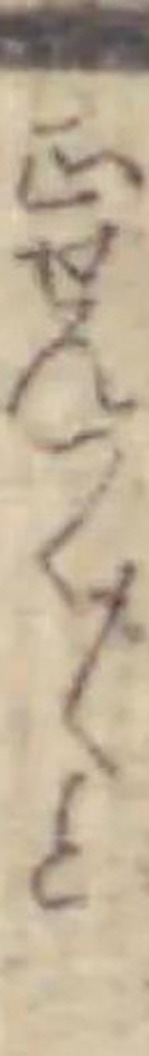正せんつく〳〵と
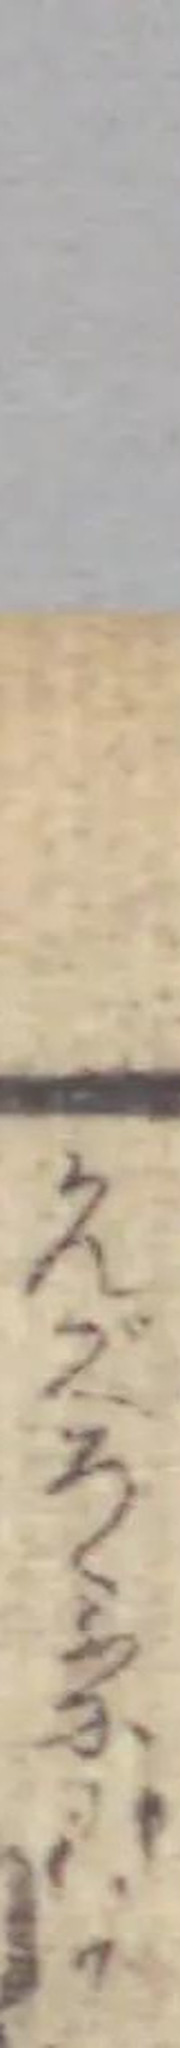かんがへろくふに
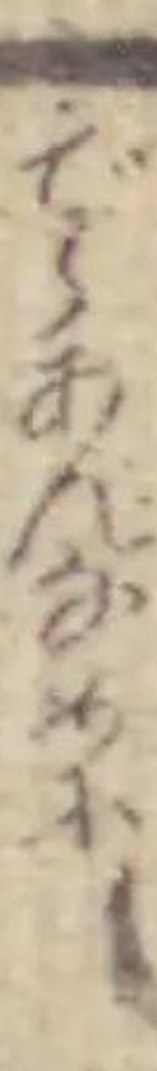でゝあんなめに
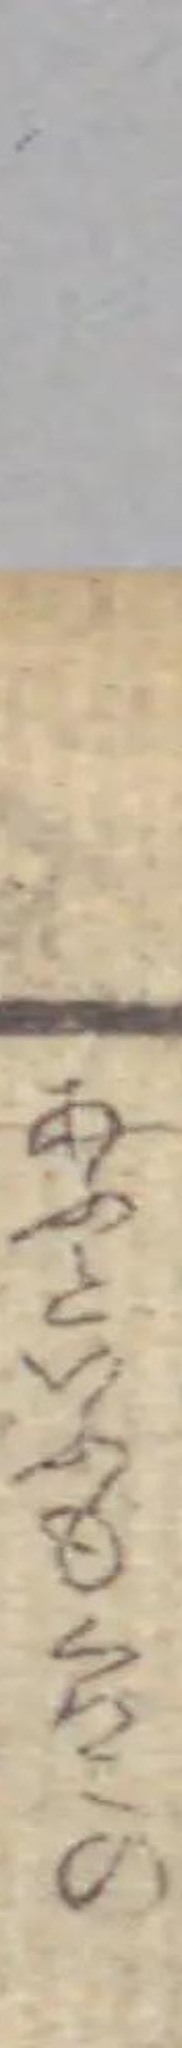あふといふもくはこの
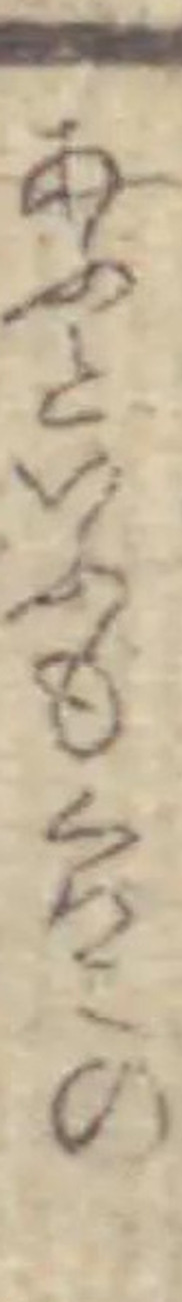あふといふもくはこの
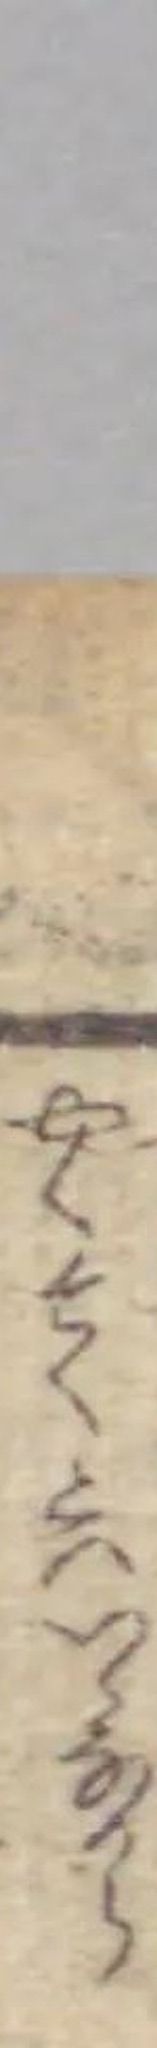やくそくとはいゝなから
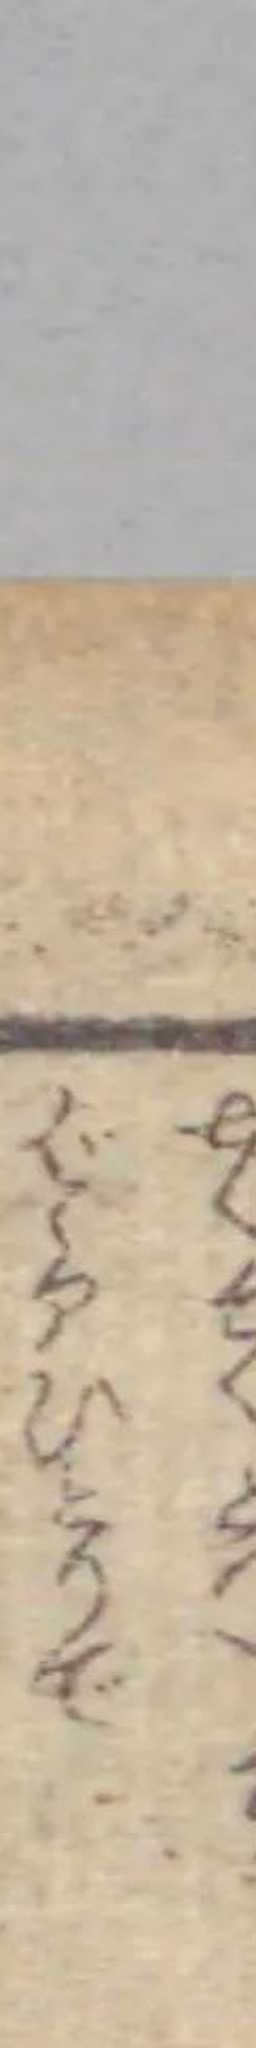ばゝあひとりで
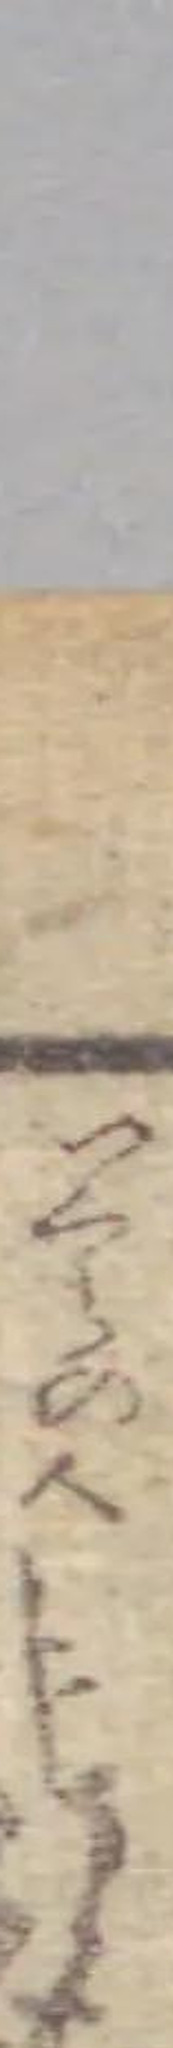いくらの人
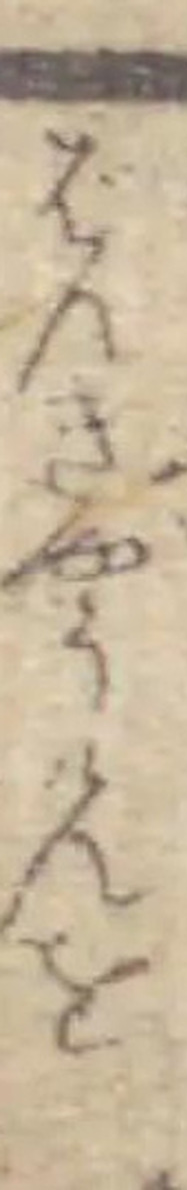ばんきやうけんを

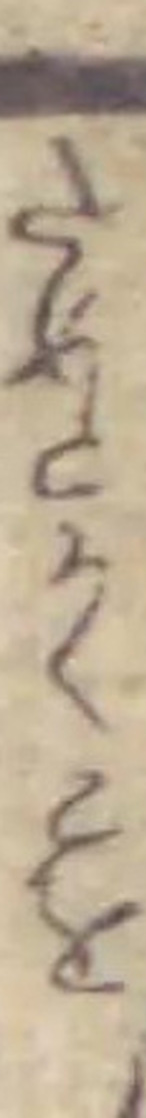ためとかくこを
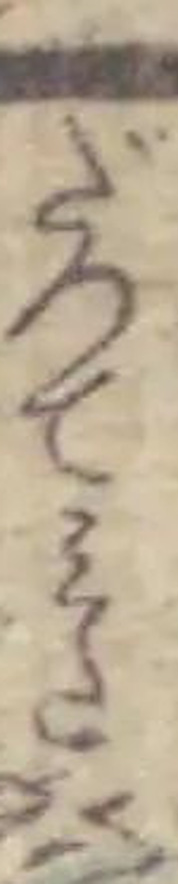だつてみた
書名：もふもふもふ怖噺 2巻
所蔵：国立国会図書館 National Diet Library, JAPAN
